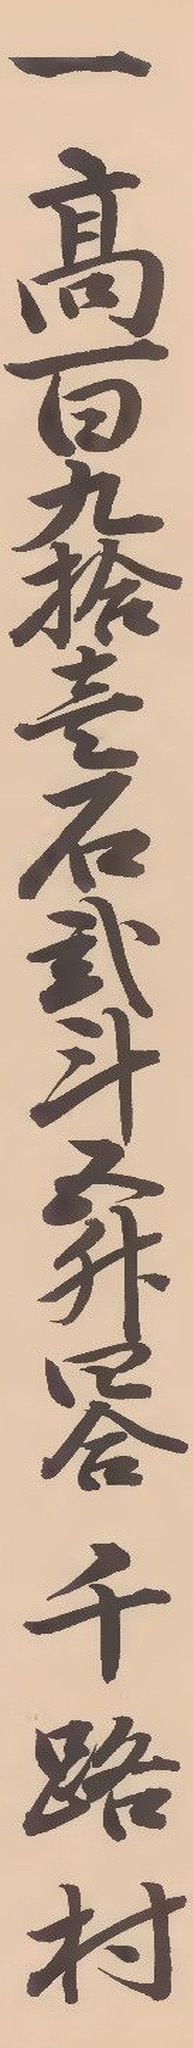一高百九拾壱石弐斗五升四合千路村
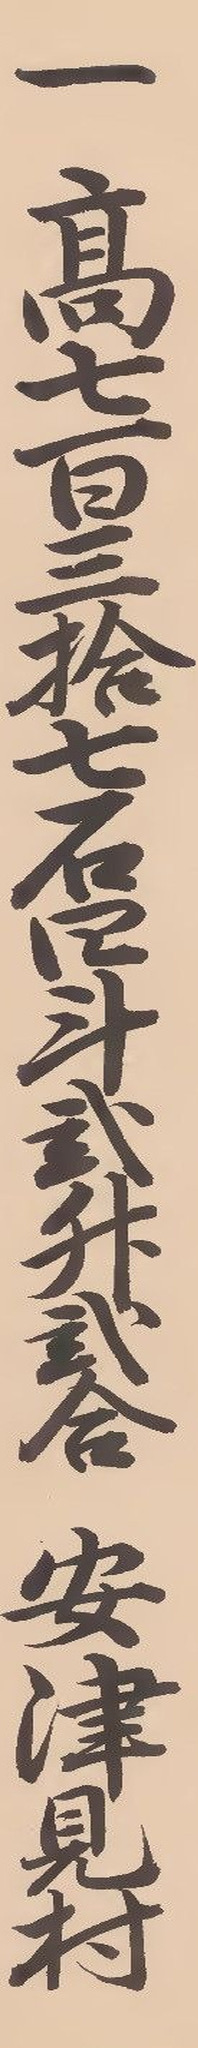一高七百三拾七石四斗弐升弐合安津見村
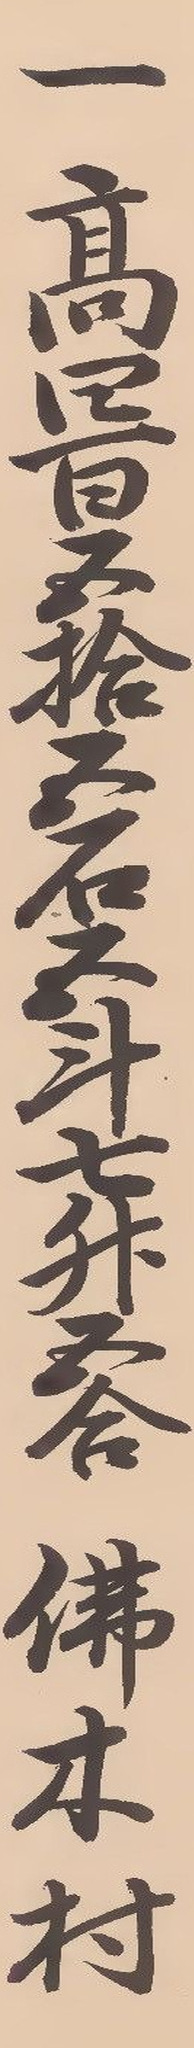一高四百五拾五石五斗七升五合仏木村
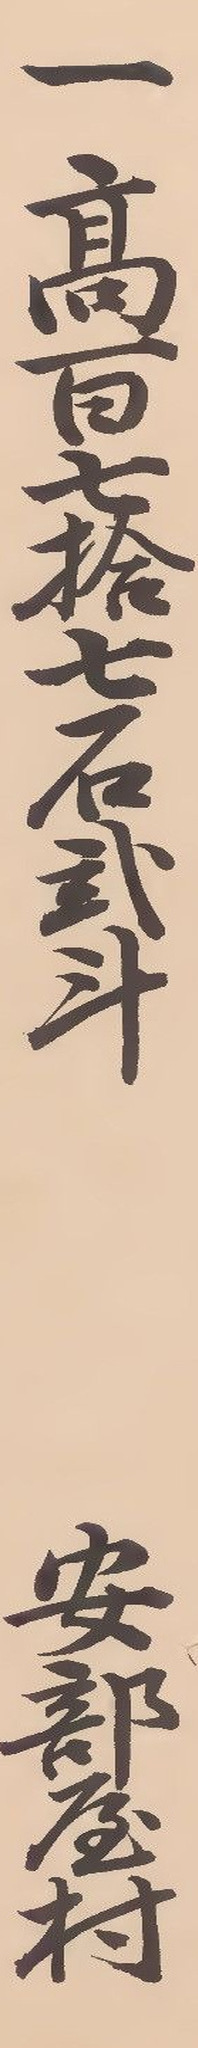一高百七拾七石弐斗安部屋村

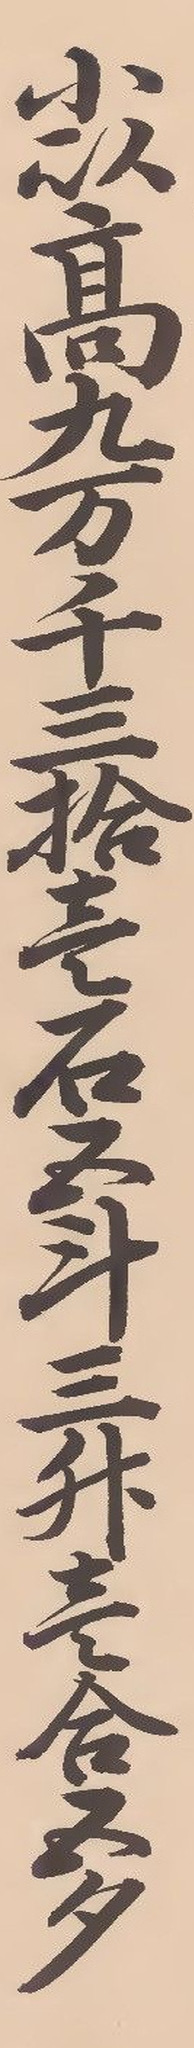小以高九万千三拾壱石五斗三升壱合五勺

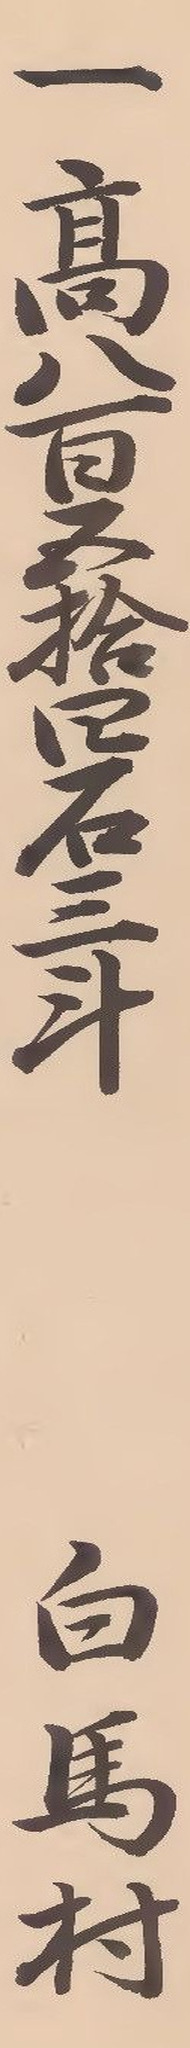一高八百五拾四石三斗白馬村
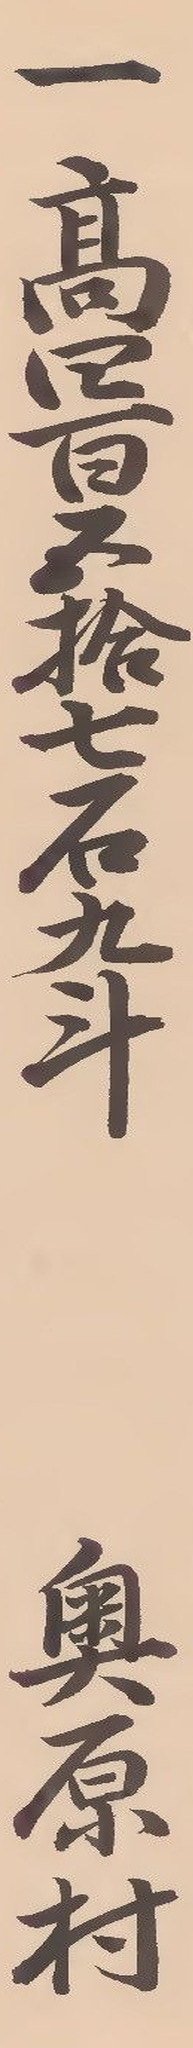一高四百五拾七石九斗奥原村
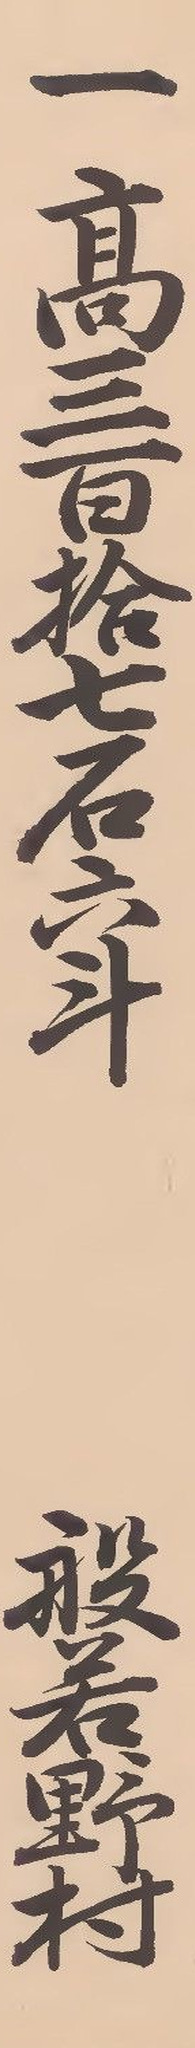一高三百拾七石六斗般若野村
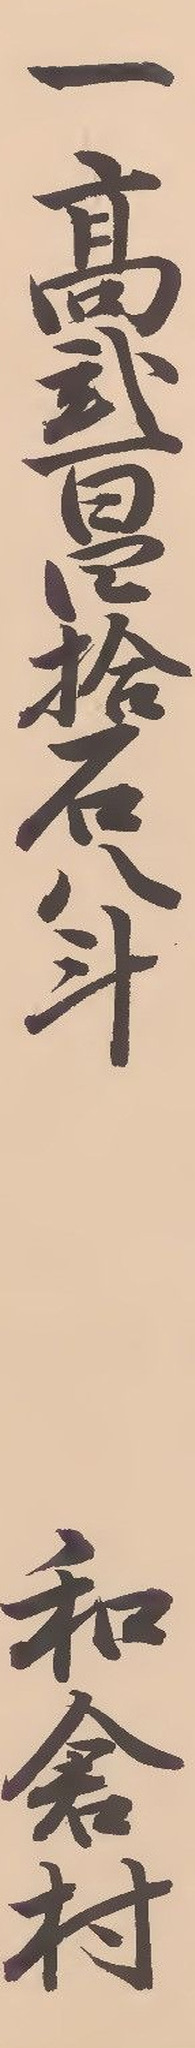一高弐百四拾石八斗和倉村

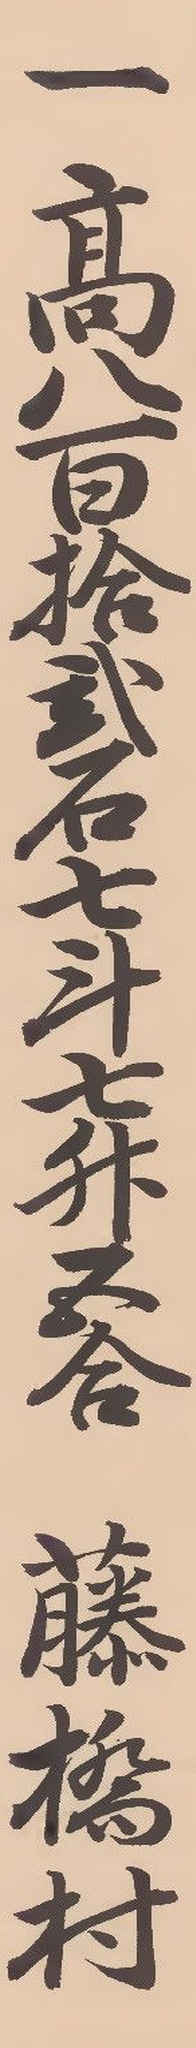一高八百拾弐石七斗七升五合藤橋村
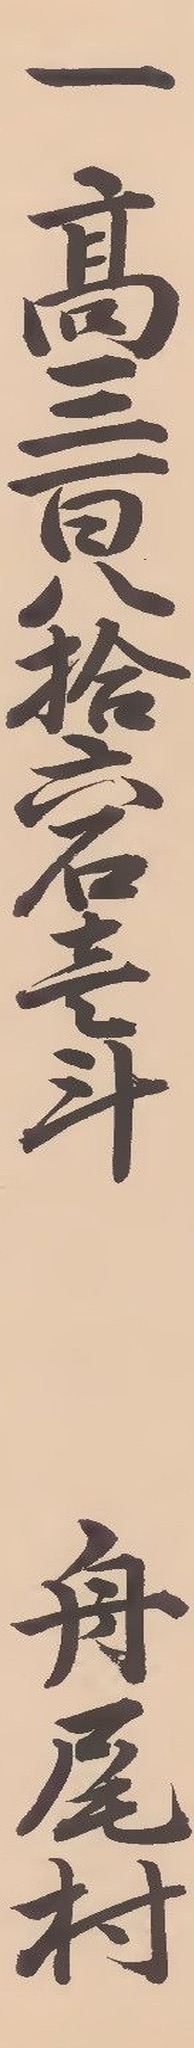一高三百八拾六石壱斗舟尾村
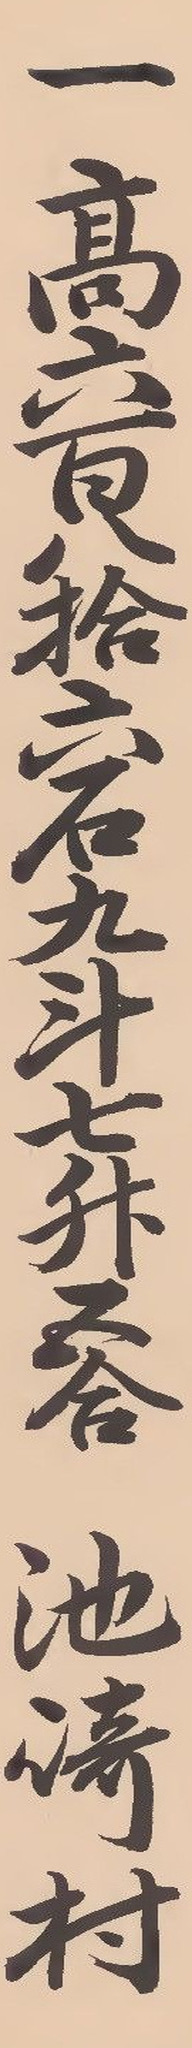一高六百八拾六石九斗七升五合池崎村
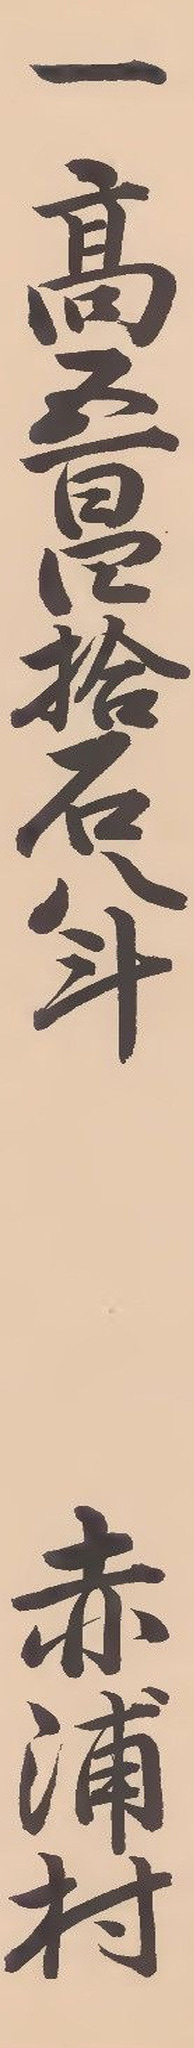一高五百四拾石八斗赤浦村
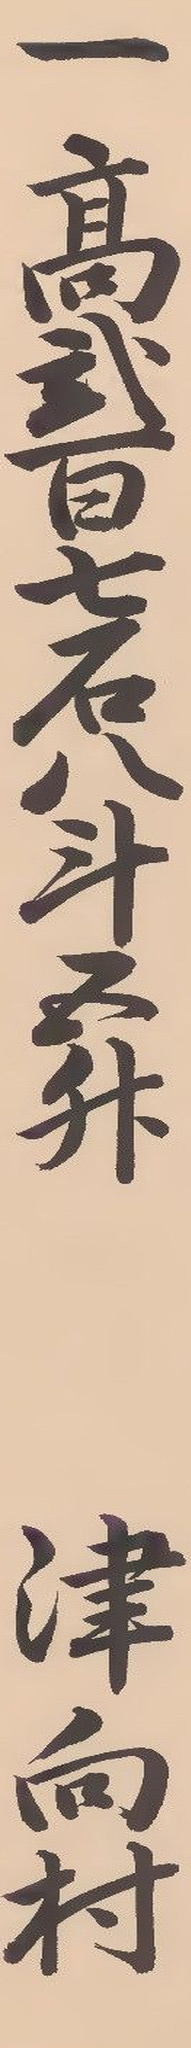一高弐百七石八斗五升津向村

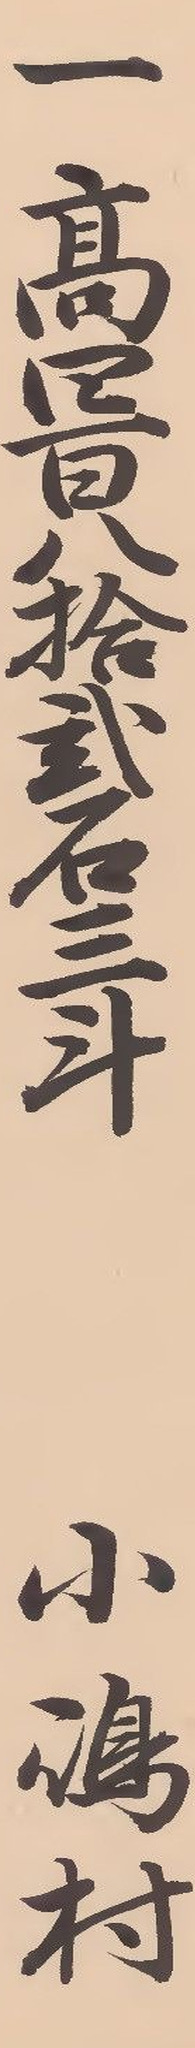一高四百八拾弐石三斗小島村
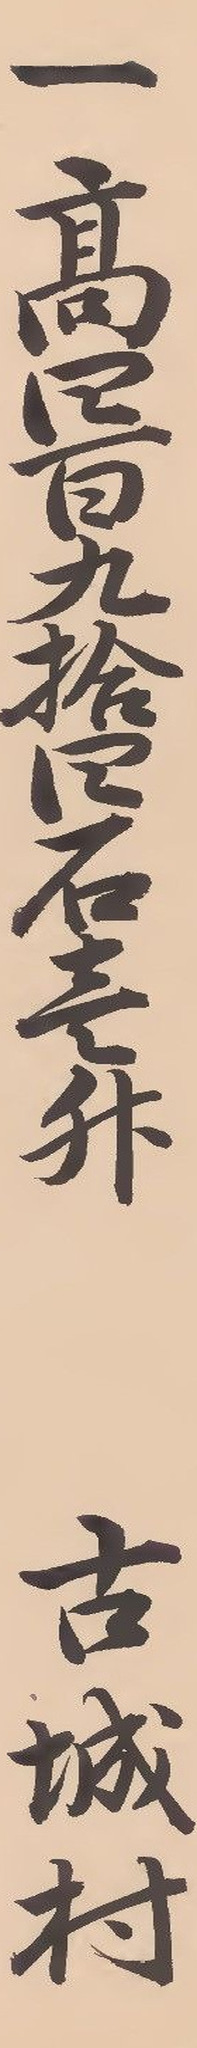一高四百九拾四石壱升古城村
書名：能登国郷帳
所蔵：国立公文書館 National Archives of Japan
